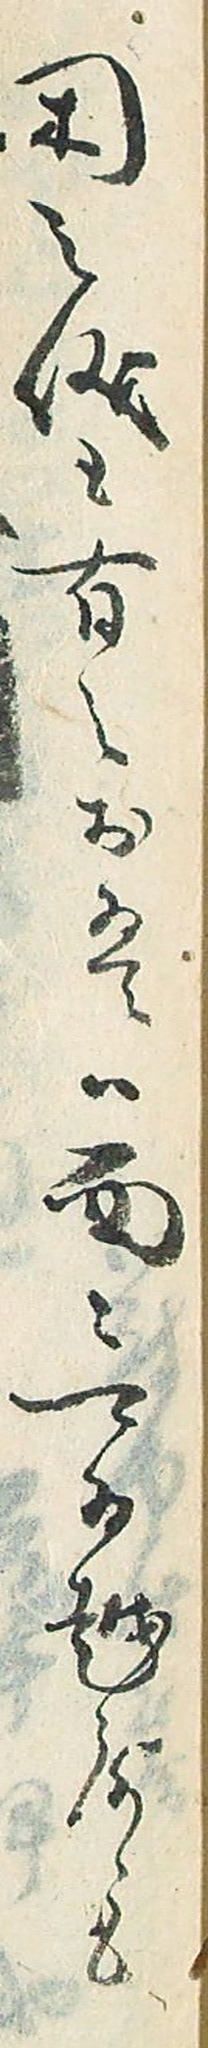閑之儀も有之におゐては面々可為越度候以上
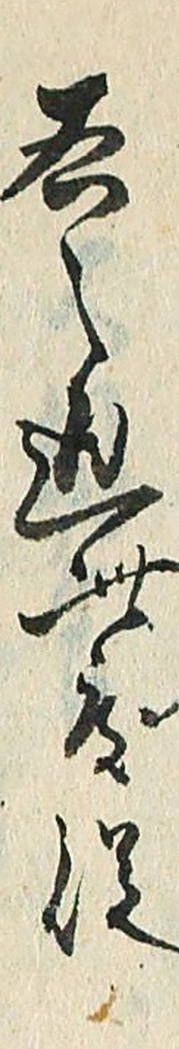右之通此度従
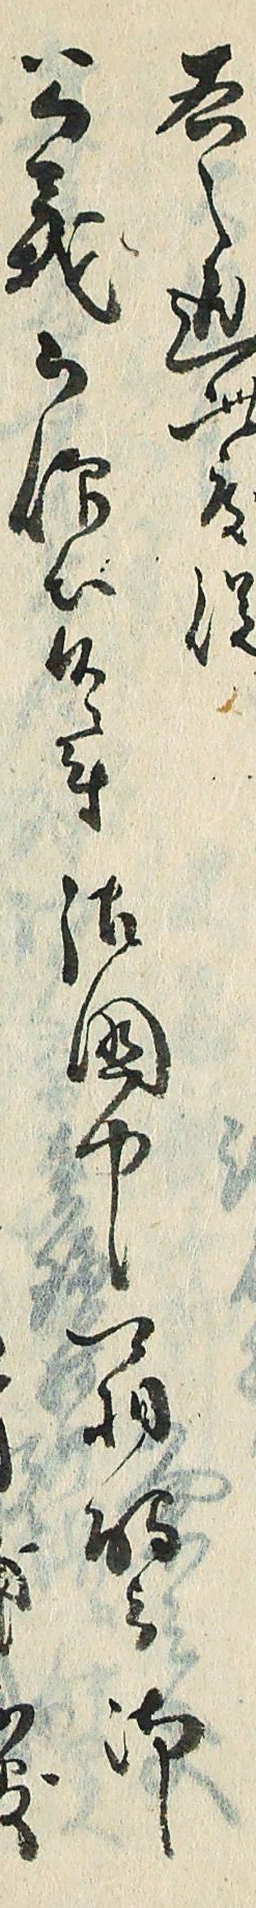公義被仰出候に付御国中可相触旨御
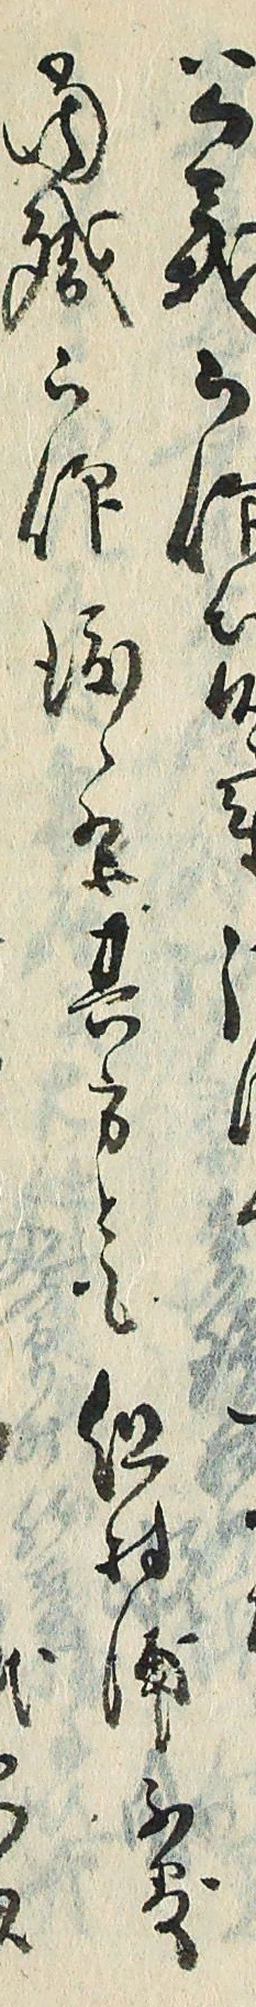当職被仰渡候条其方とも組村浦不寄
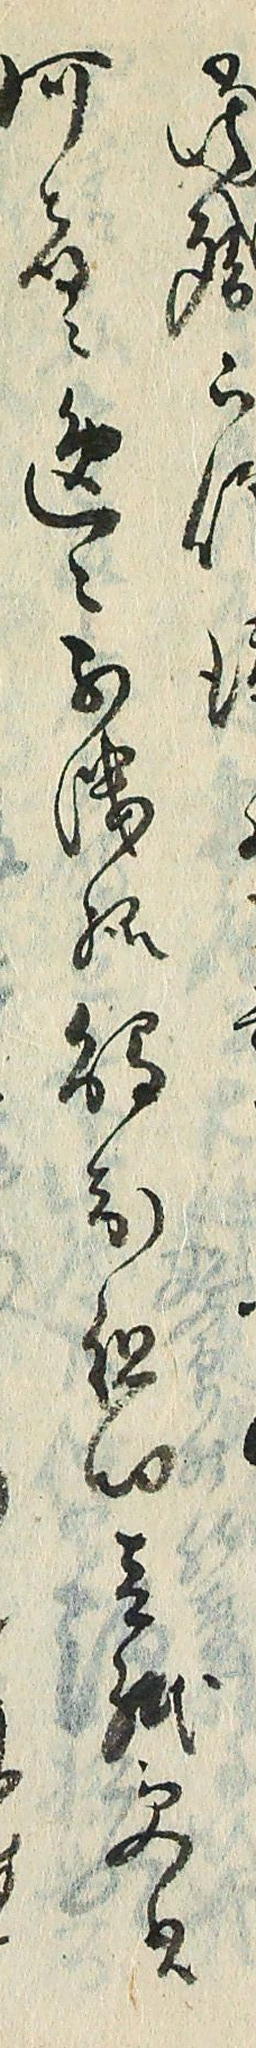何者に逸々不洩様触知組切壱紙受書
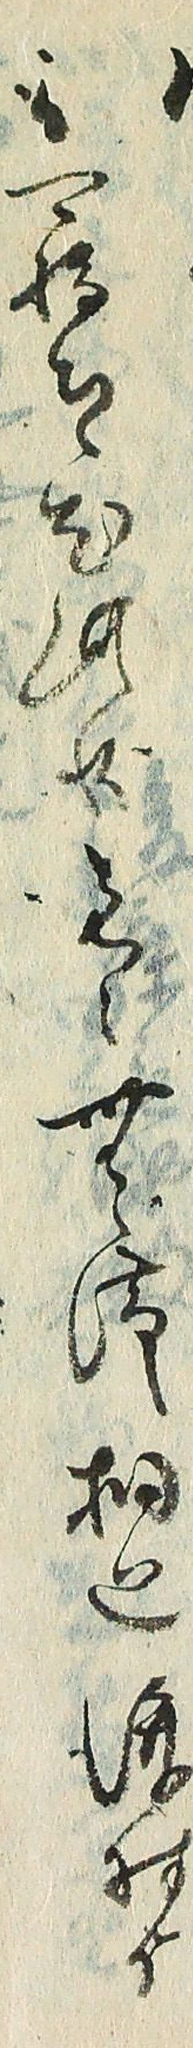取可指出候尤此状先々無滞相廻済村ゟ
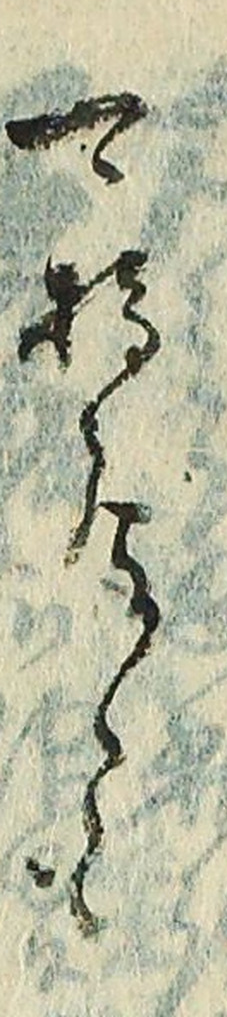可指戻候以上
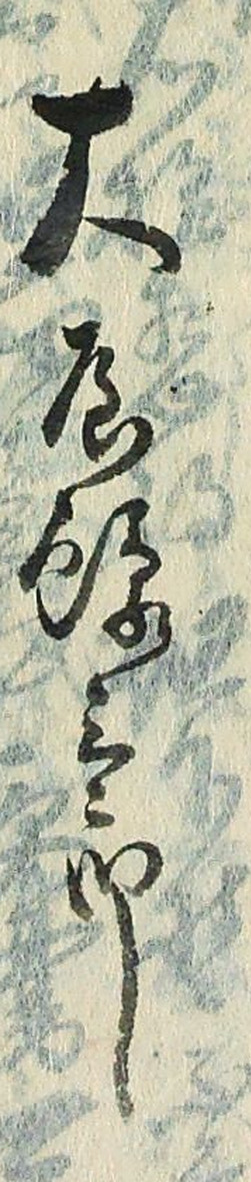大屋予三郎
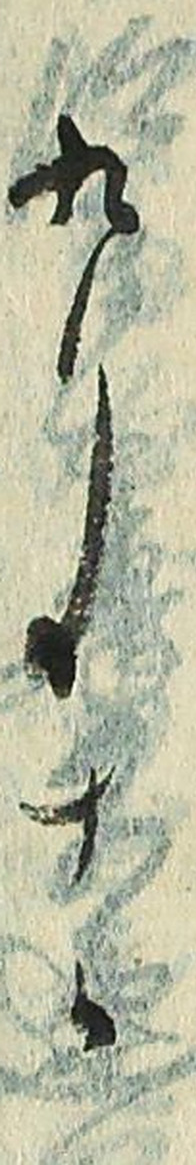九月十日
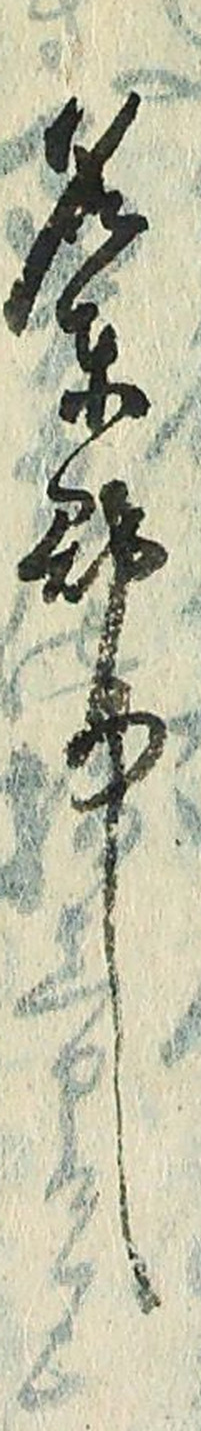名東郡中
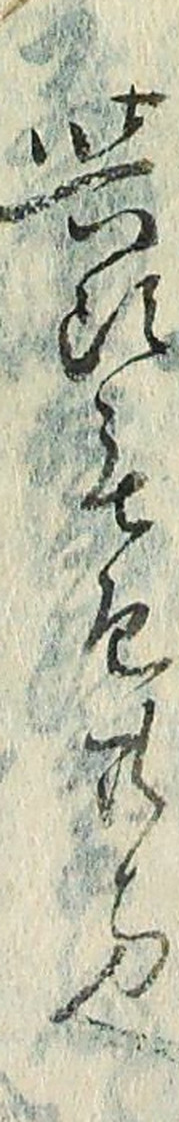与頭庄屋共方へ
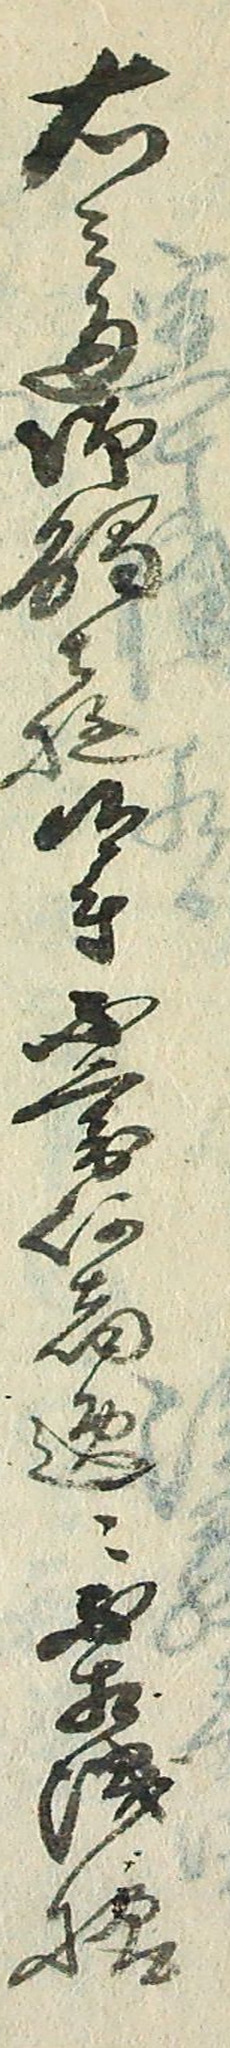右之通御触被遊候に付不寄何者逸々不相洩様
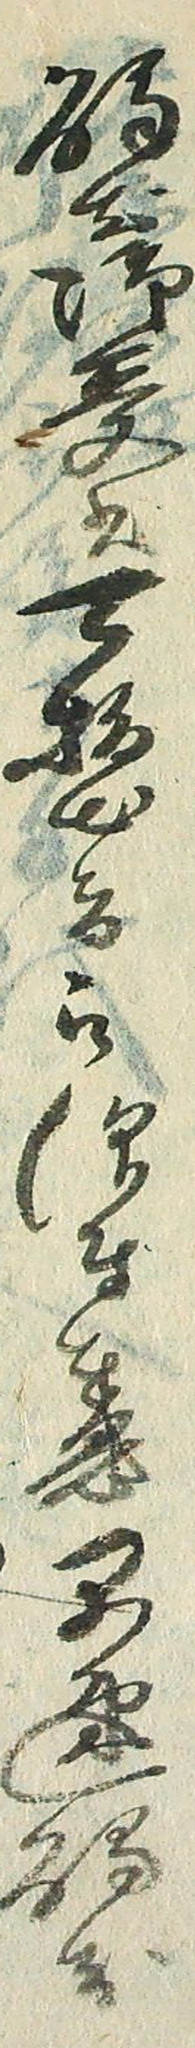触知御受書可指出旨被仰付奉畏早速触知
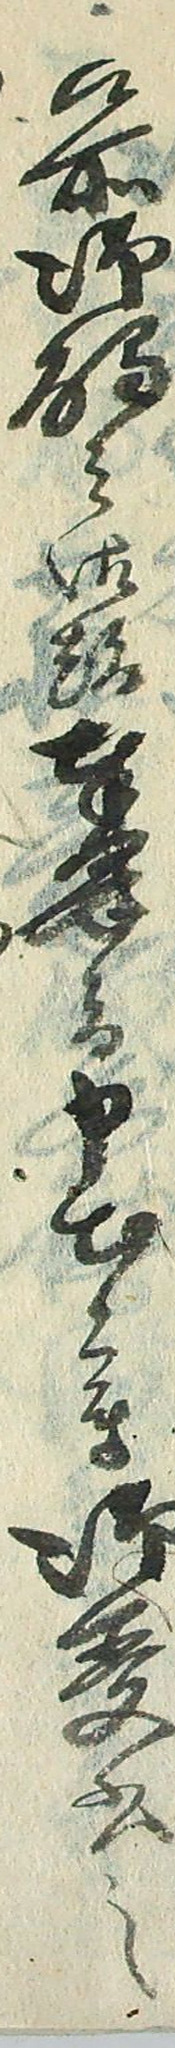候所御触之御趣奉畏旨申出候に付御受書之
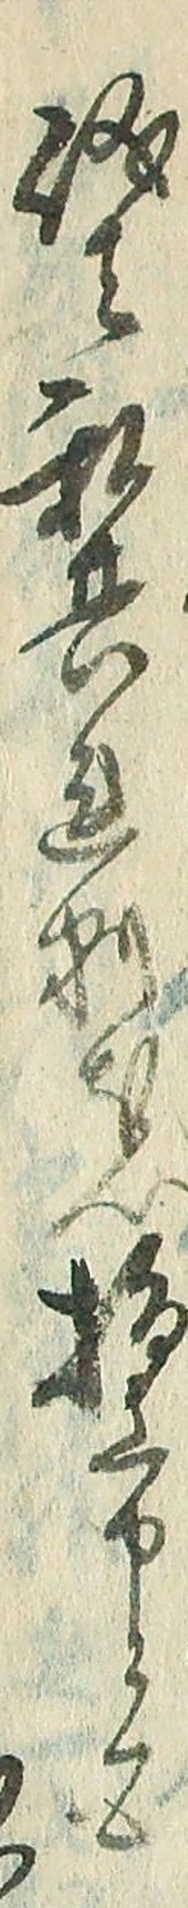儀は私共連判を以指上申候以上
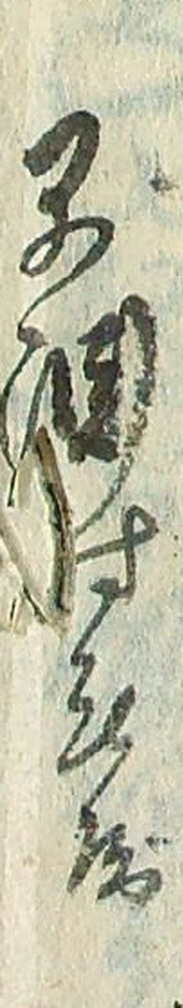早淵村庄屋
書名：諸御用御□受書控
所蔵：鳴門教育大学 Naruto University of Education
